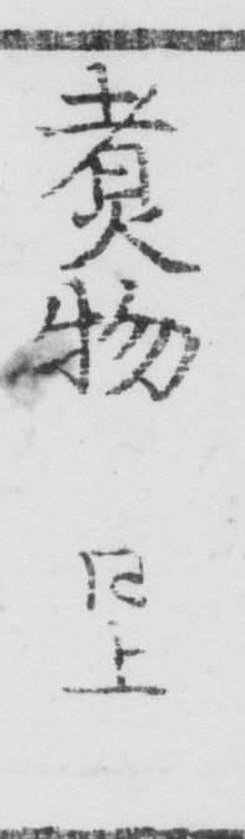煮物同上
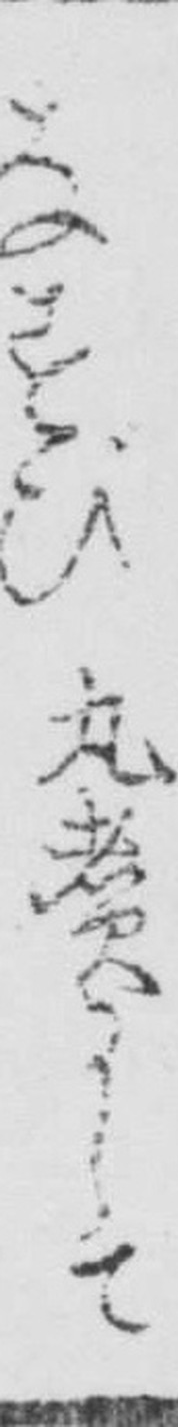なすび丸煮にして
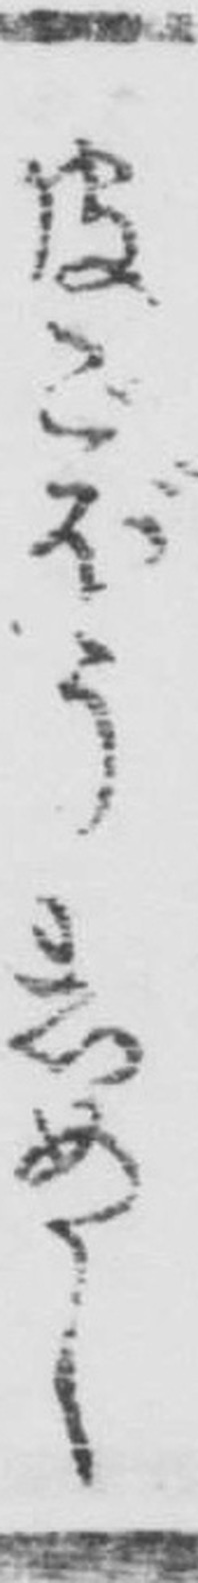皮ごぼうしめし
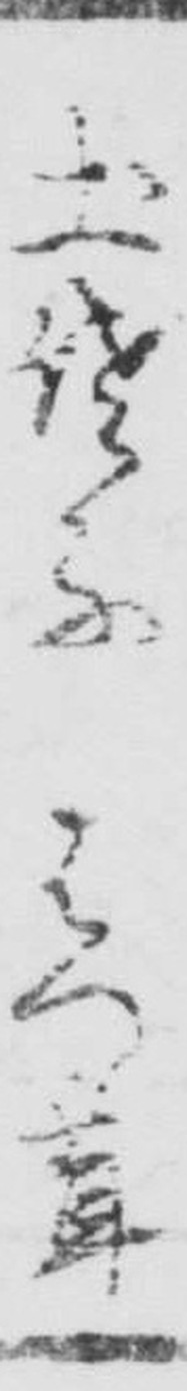土佐ふはつ茸
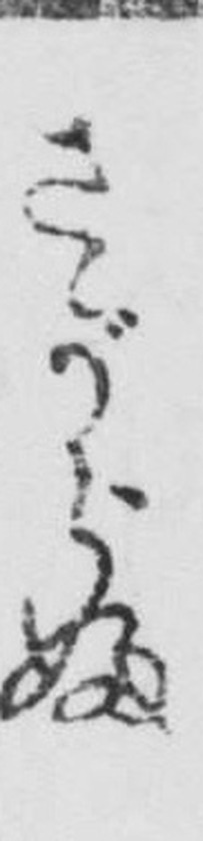さがらふ
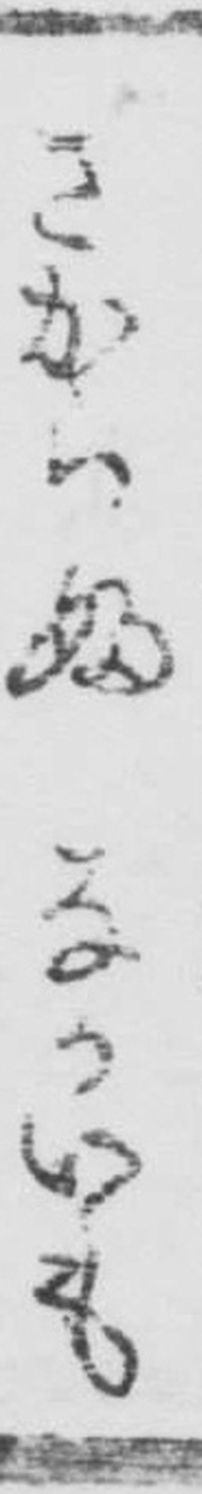さからふなかいも
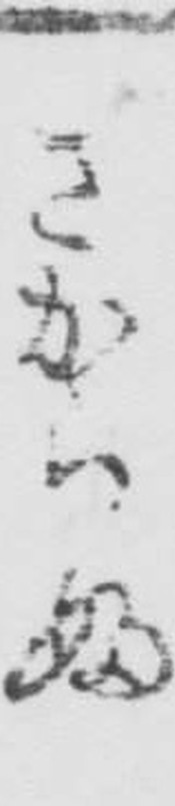さがらふ
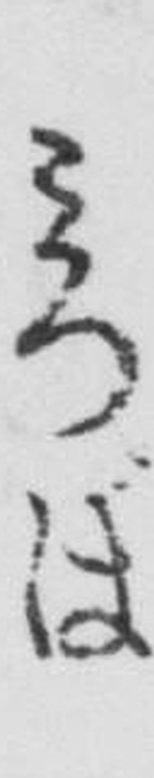みつば
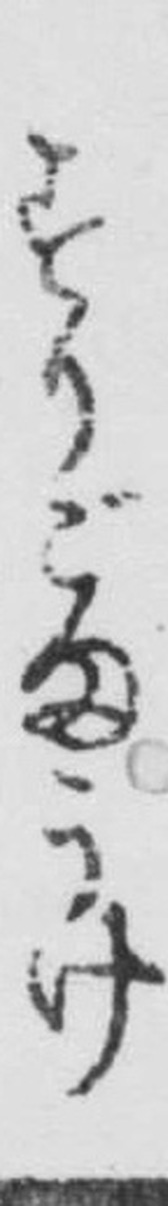すりごまかけ
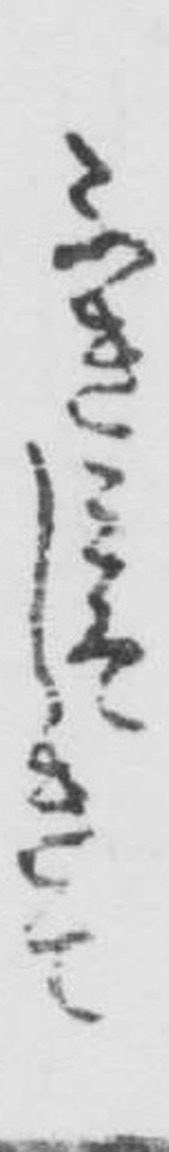ふきみそしきて
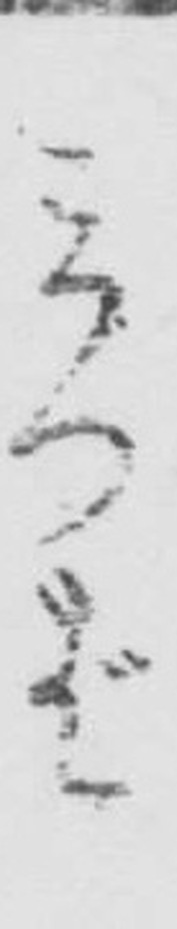みつば
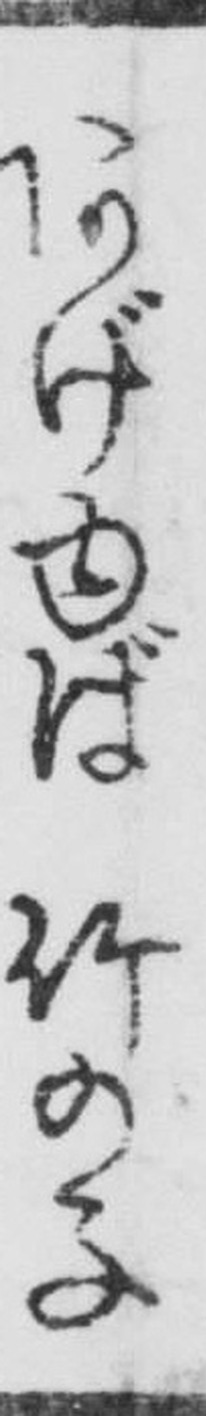あげゆば竹の子
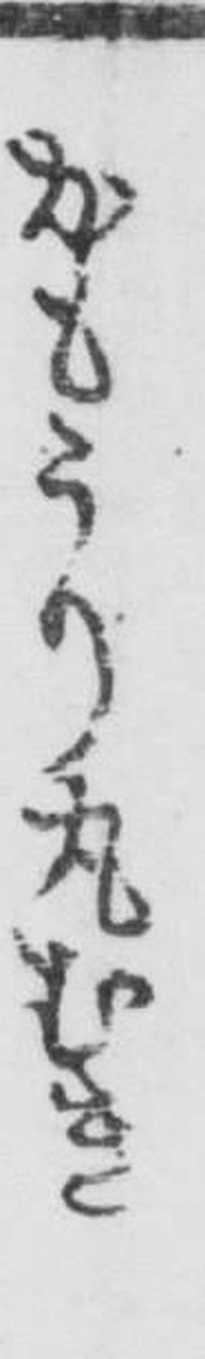かもうり丸むき
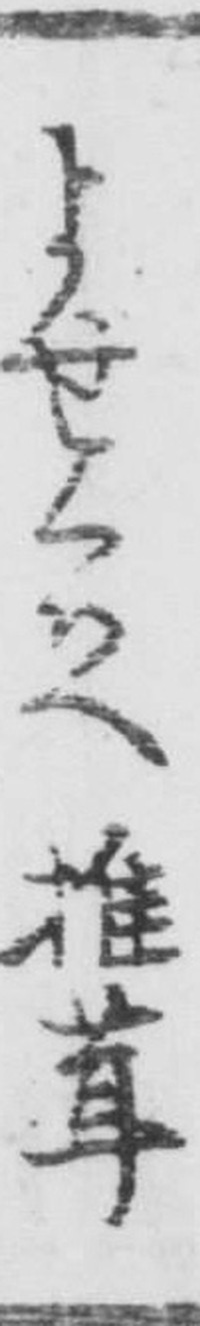よせくはへ椎茸
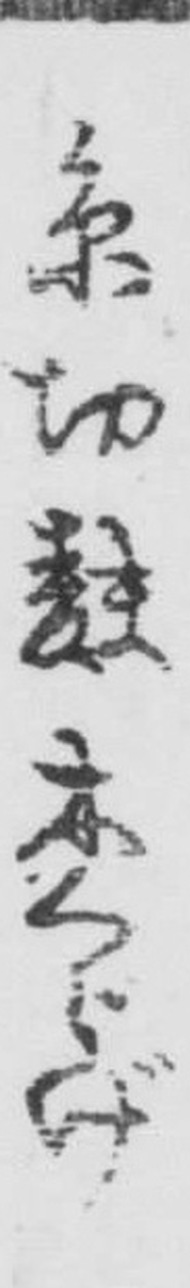糸切麩木くらげ
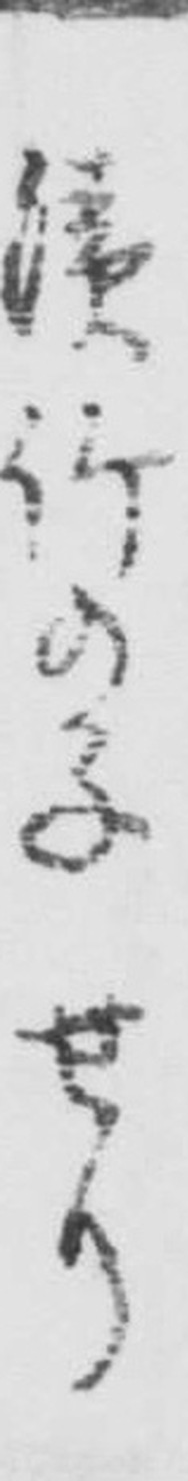漬竹の子せり
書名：諸家通用/即席料理
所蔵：大阪府立大学学術情報センター 国文学研究資料館
